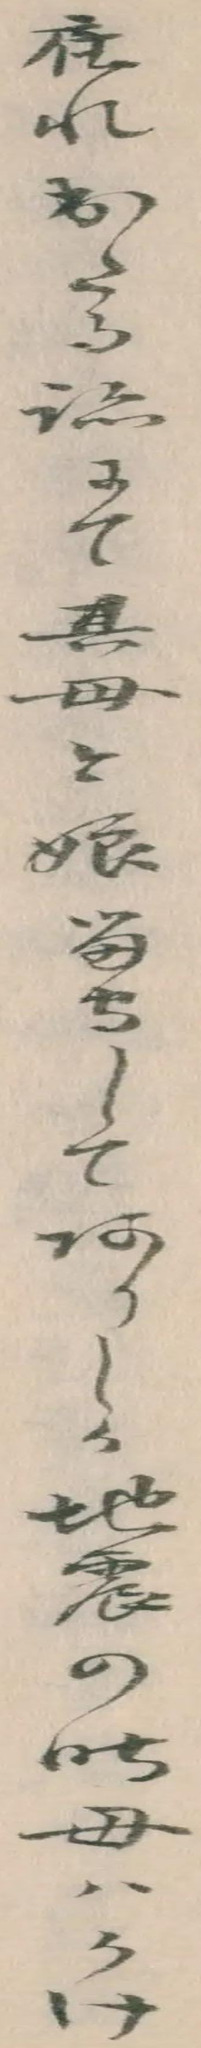雇れ出たる跡にて其母と娘留守してありしか地震の時母はかけ
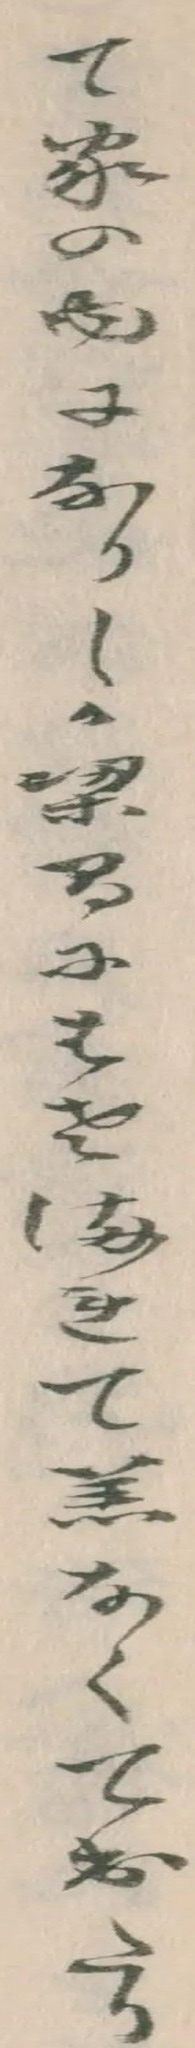て家の内になりしか梁間にはさまれて恙なくて出たり
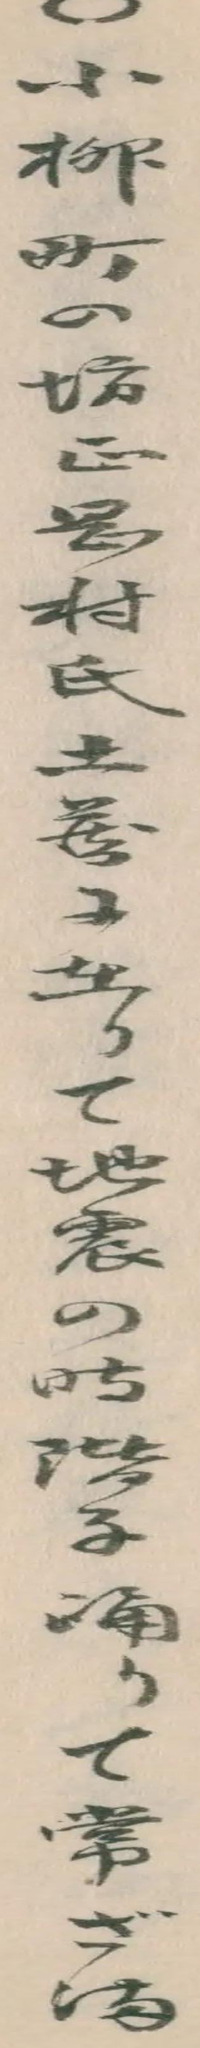〇小柳町の坊正岡村氏土蔵に在りて地震の時階子踊りて常ざま
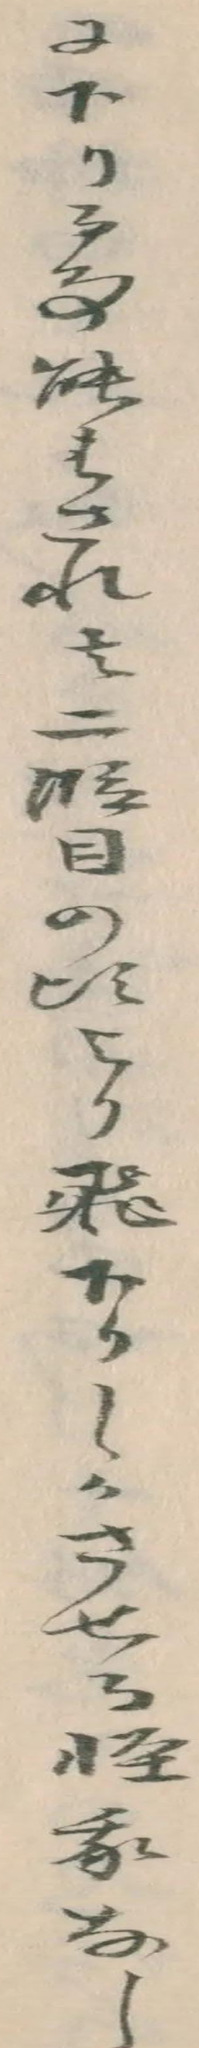に下りる事能はされは二段目の頃より飛下りしかさせる怪我なし
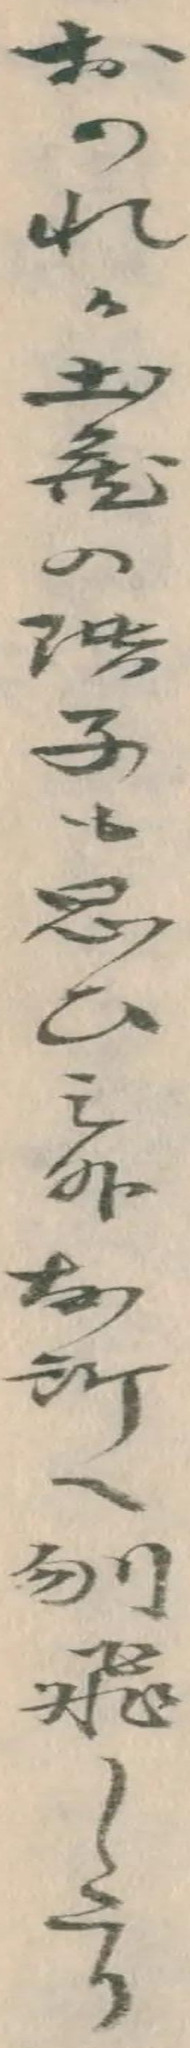おのれか土蔵の階子も思ひ之外な所へ刎飛したり

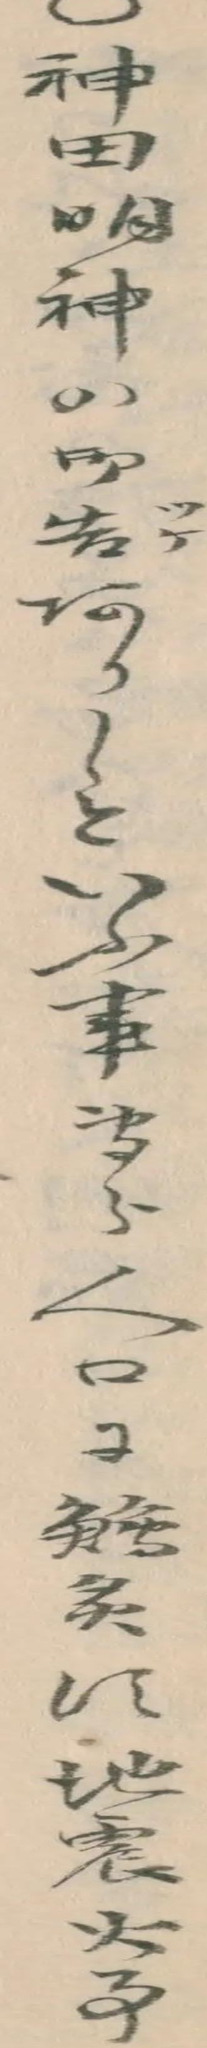〇神田明神の御告ありしといふ事専ら人口に鱠炙す地震火事
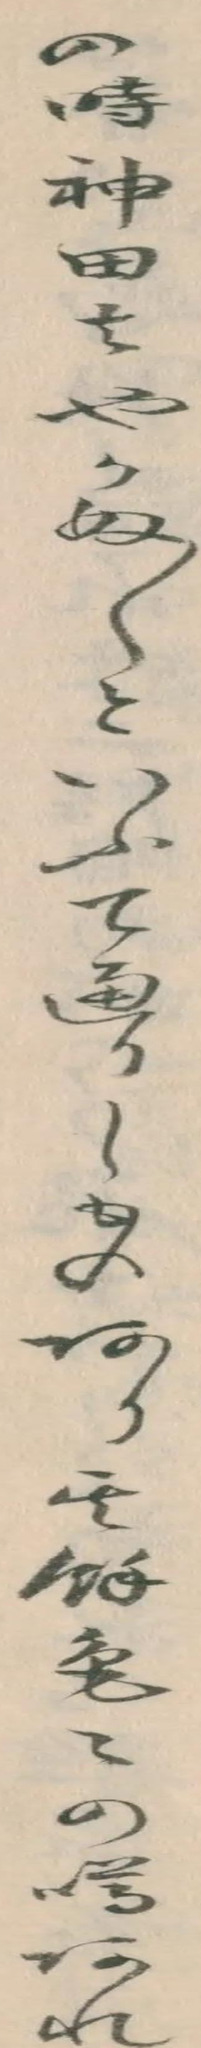の時神田はやかぬ〳〵といふて通りしものあり其余色々の噂あれ
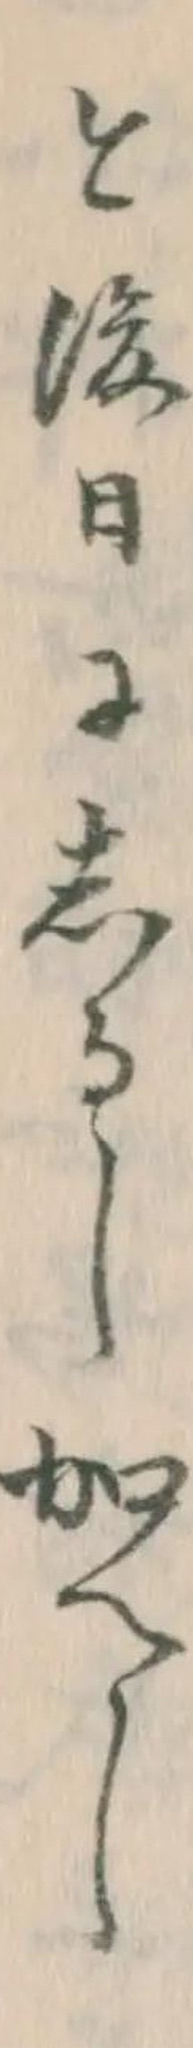と後日にしるし加へし
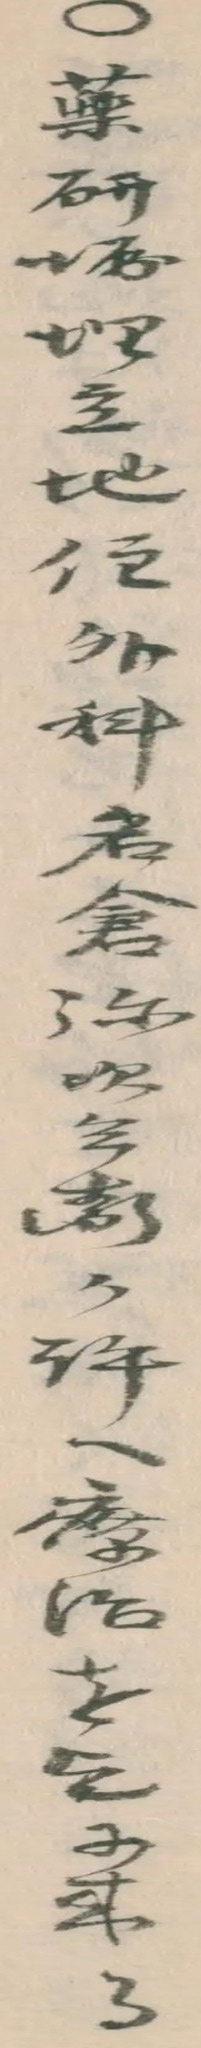〇薬研堀埋立地住外科名倉弥次兵衛か許へ療治を乞に来る
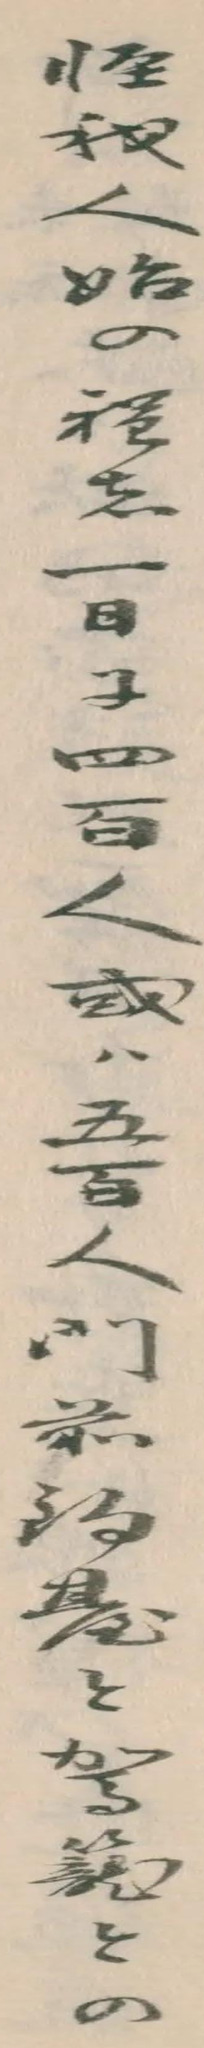怪我人始の程は一日に四百人或は五百人門前釣台と駕籠との
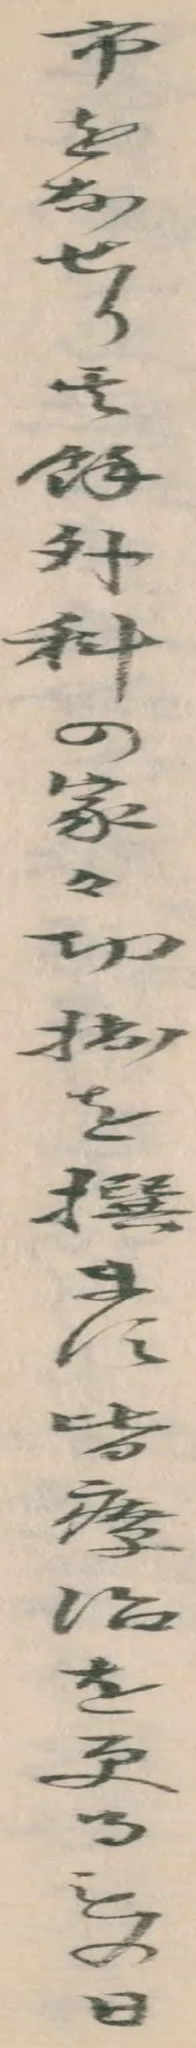市をなせり其余外科の家々功拙を撰ます皆療治を受るもの日
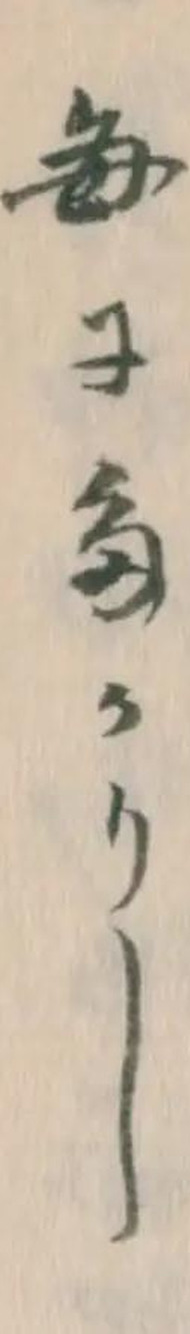毎に多かりし
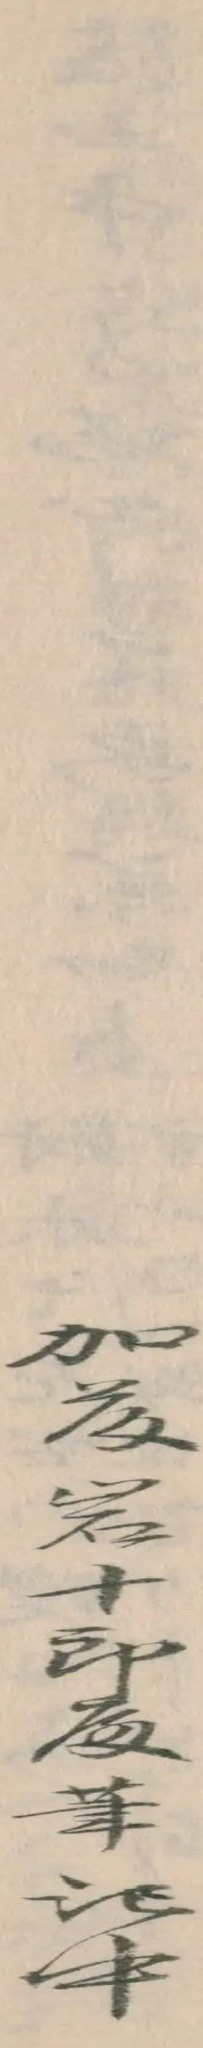加藤岩十郎殿筆記中
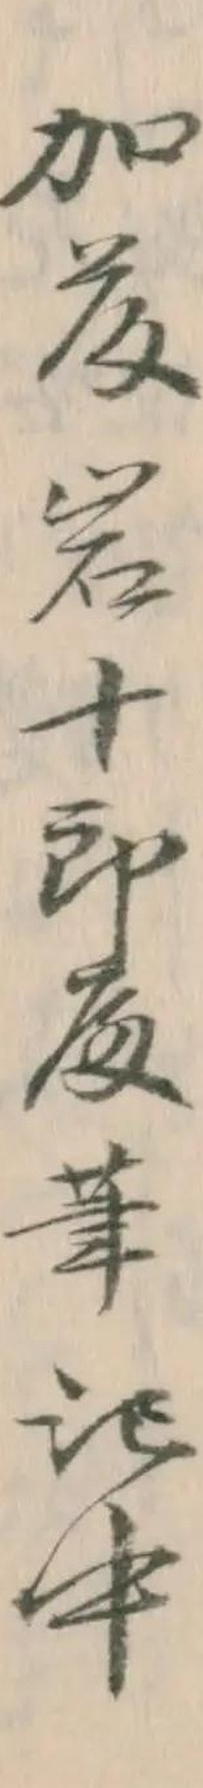加藤岩十郎殿筆記中
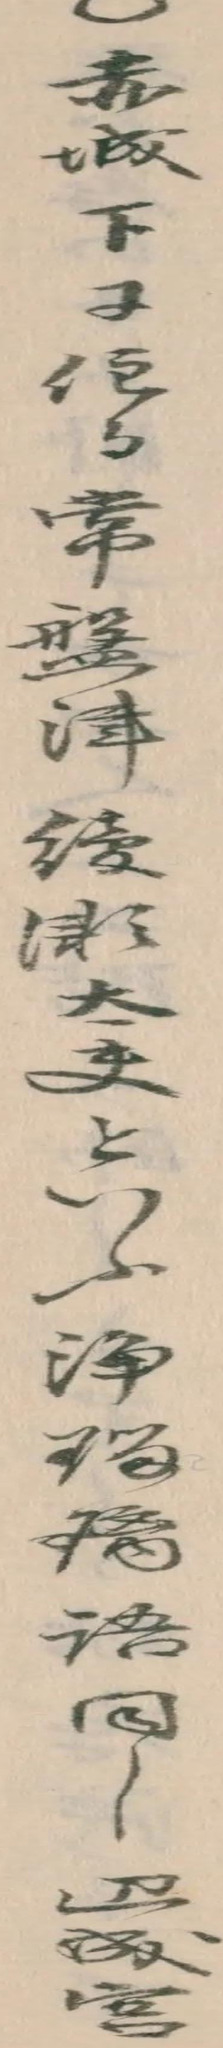〇赤城下に住る常盤津続瀬太夫といふ浄瑠璃語同し辺成宮
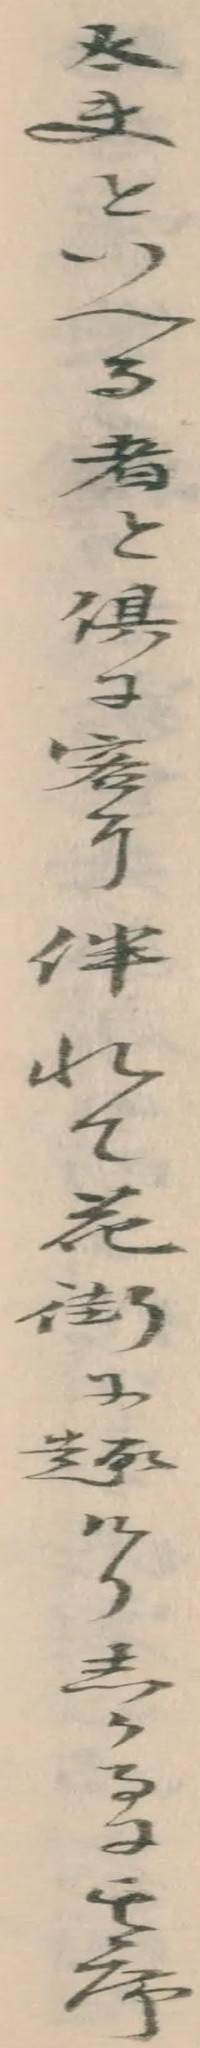太夫といへる者と倶に客に伴れて花街に趣けりしかるに其席
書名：地災撮要. 巻7-9(地震之部)
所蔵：国立国会図書館 National Diet Library, JAPAN
